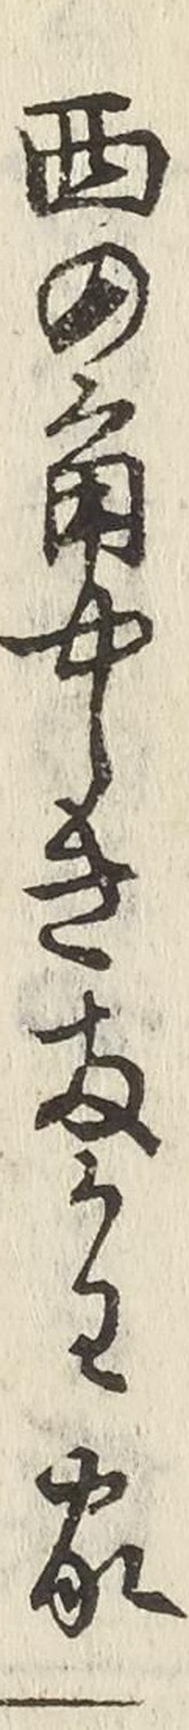西の角やしき両かわ家
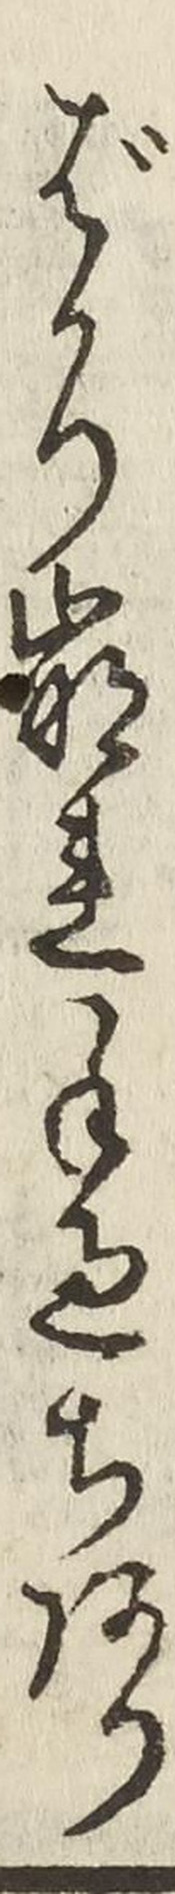ばかり崩れ手過ちあり
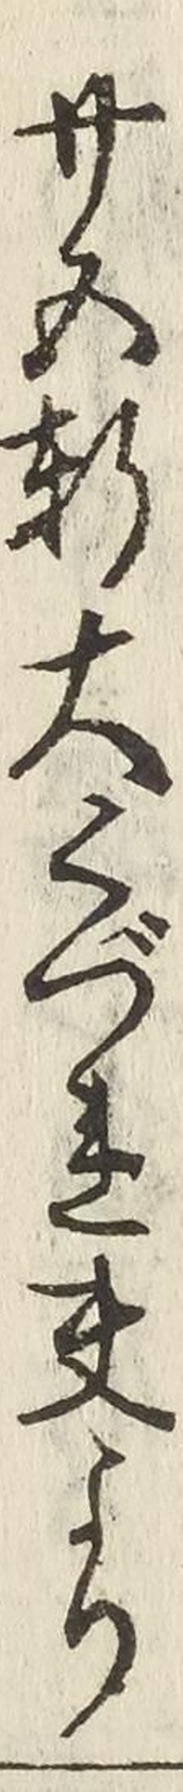廿五軒大くづれ夫より
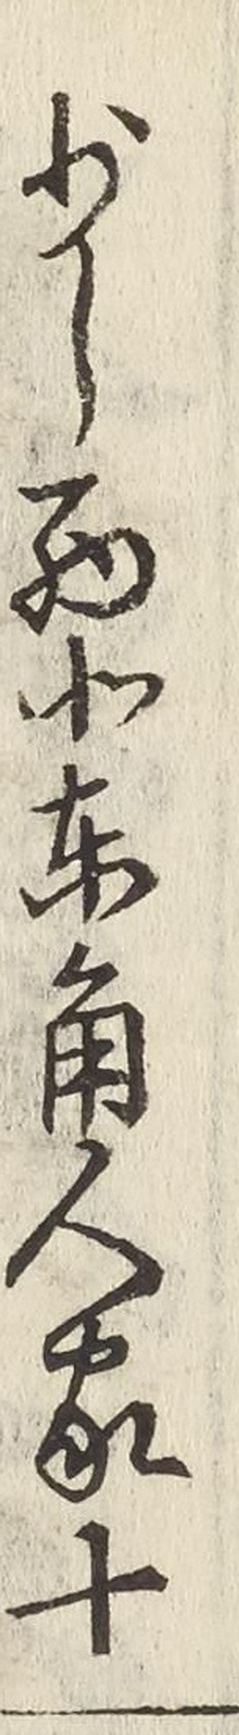少し西北東角人家十
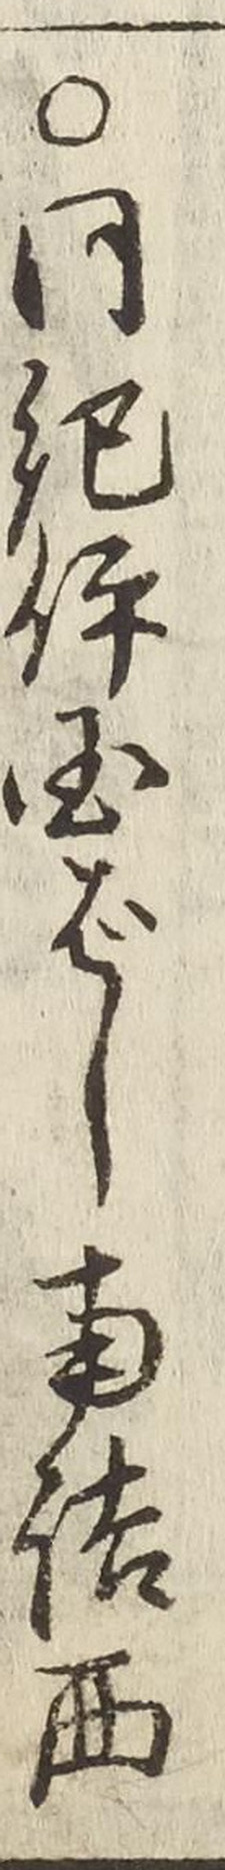○同紀伊国ばし南詰西
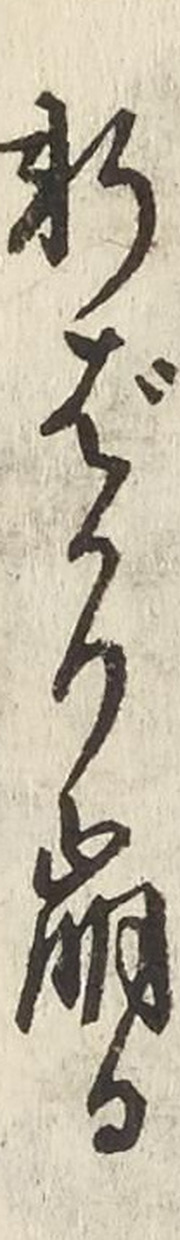軒ばかり崩る
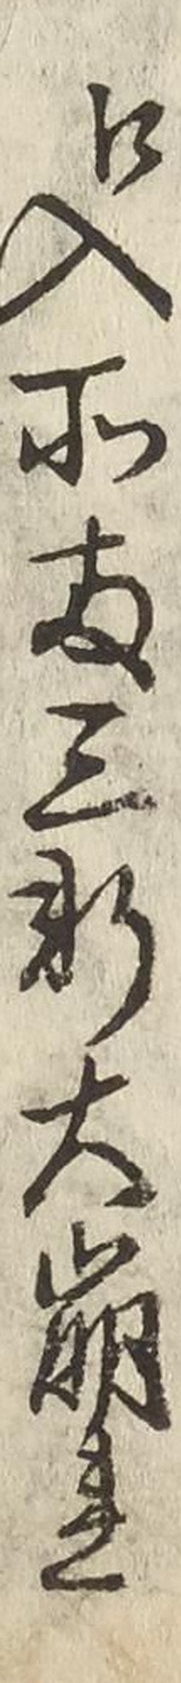江入所両三軒大崩れ

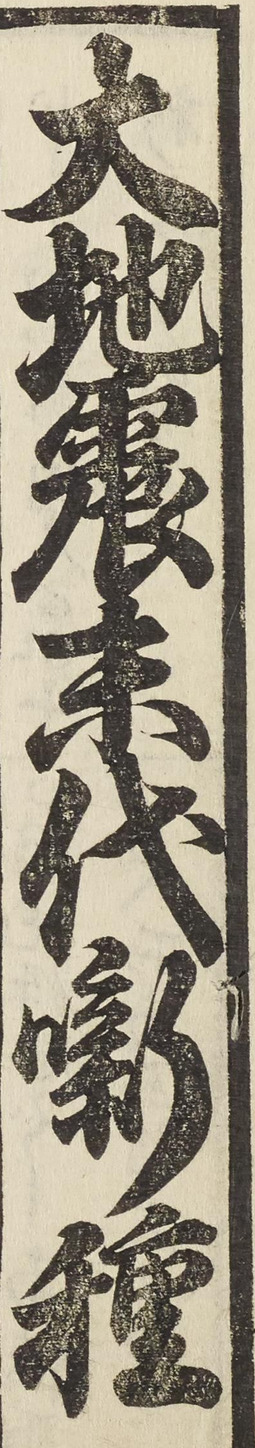大地震末代噺種
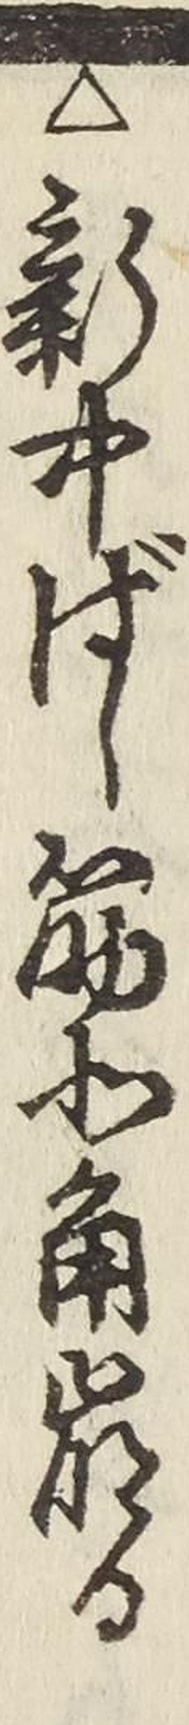△新中ばし筋北角崩る
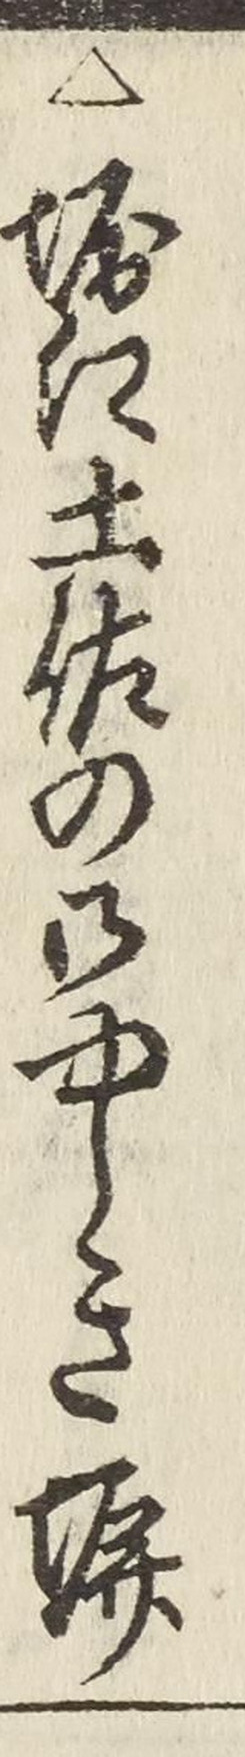△堀江土佐の御やしき塀
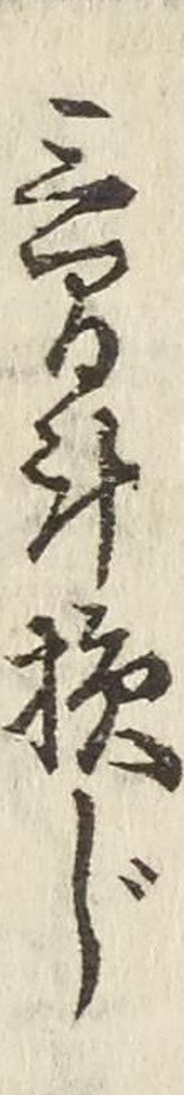三間計損じ
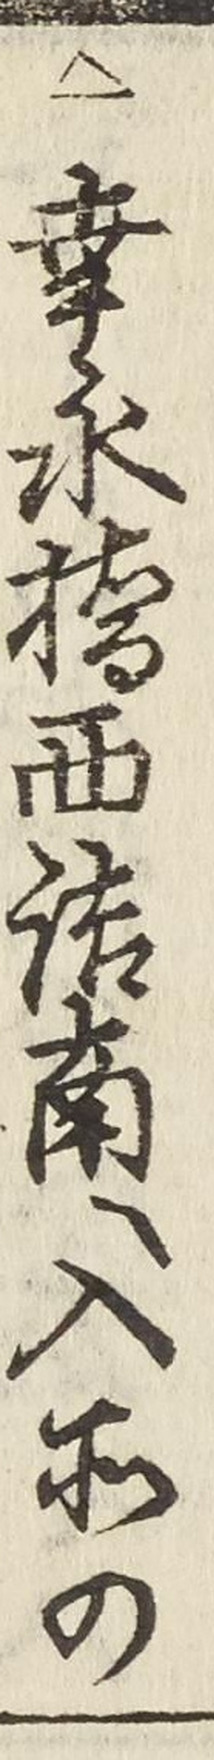△幸永橋西詰南へ入所の
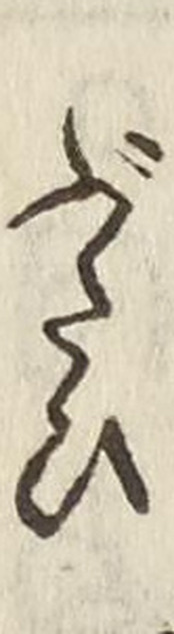ぶたひ
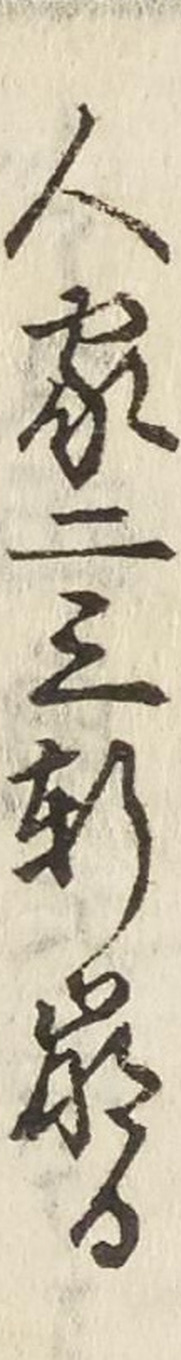人家二三軒崩る
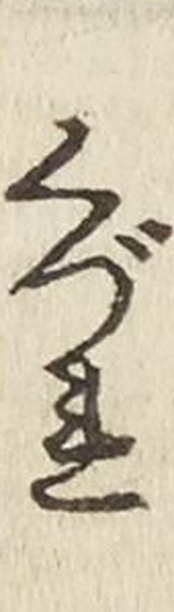くづれ
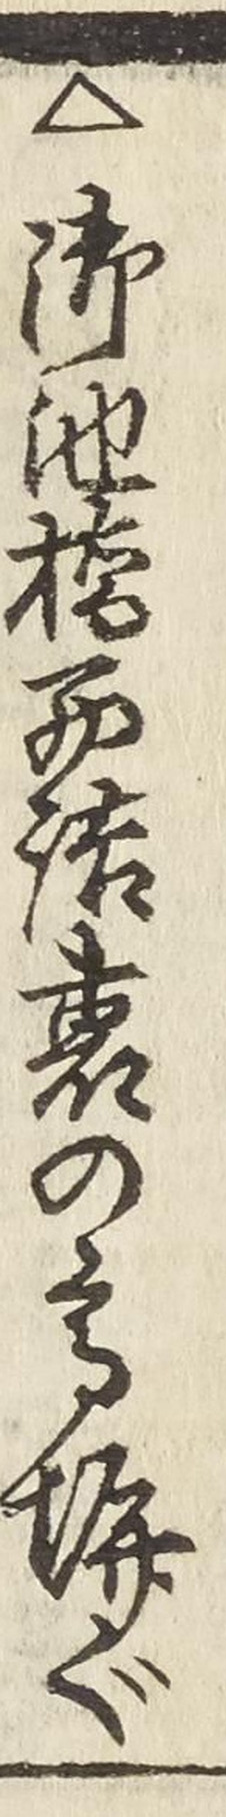△御池橋西詰裏の高塀ぐ
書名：大地震大津浪末代噺種　（二編　全）
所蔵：東京大学地震研究所図書室 Earthquake Research Institute Library, The University of Tokyo, JAPAN
